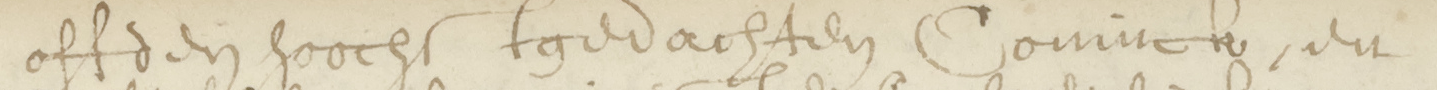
off den hoochstgedachten Coninck, en
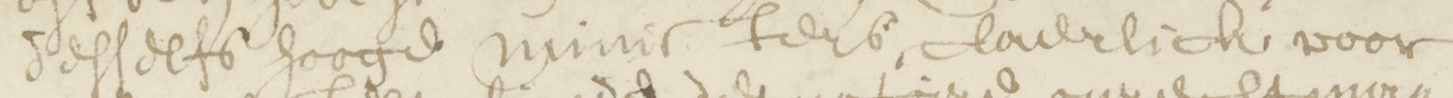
desselfs hooge Ministers, claerlick voor
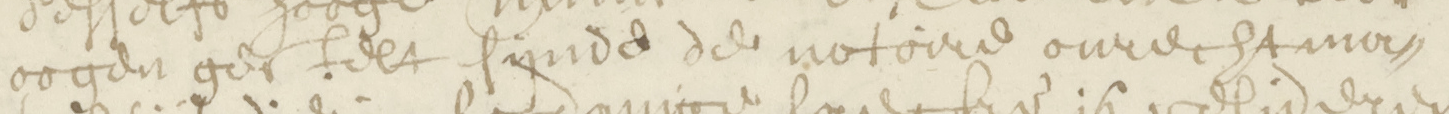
oogen gestelt sijnde de notoire onrechtma„
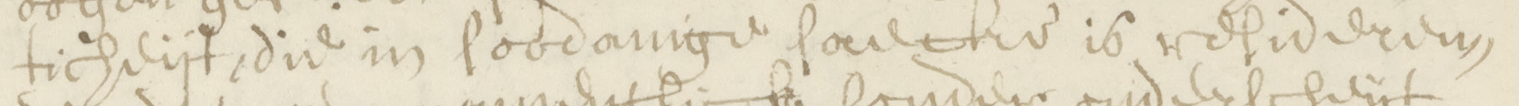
ticheijt, die in soodanige saecke is resideren„
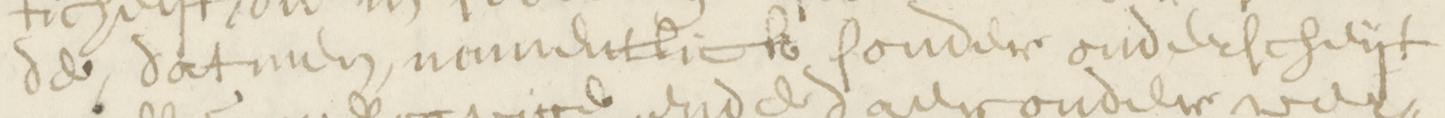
de, datmen, namentlick sonder onderscheijt
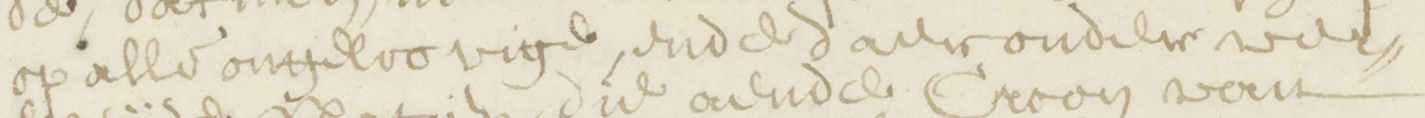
op alle ongeloovige, ende daeronder ver„
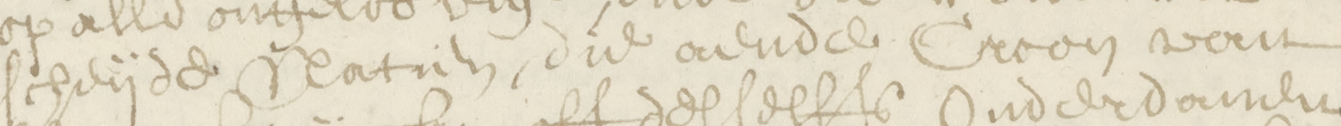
scheijde Natien, die aende Croon van
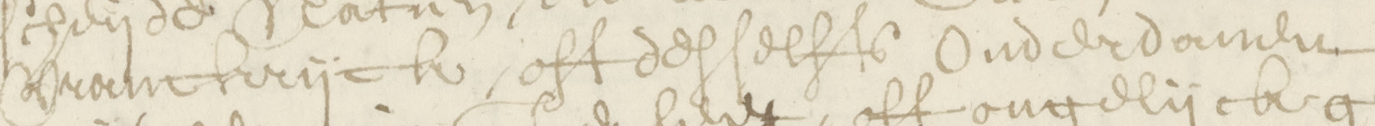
Vranckrijck, off desselffs Onderdanen
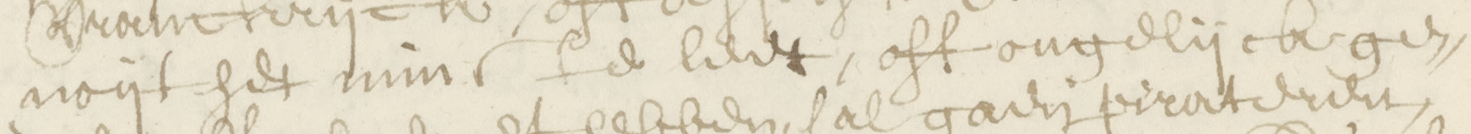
noijt het minste leet, off ongelijck ge„
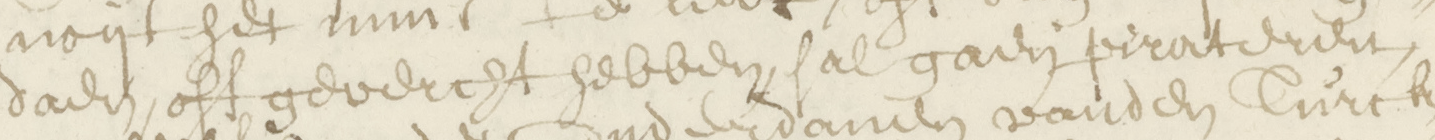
daen, off gevercht hebben, sal gaen pirateren,
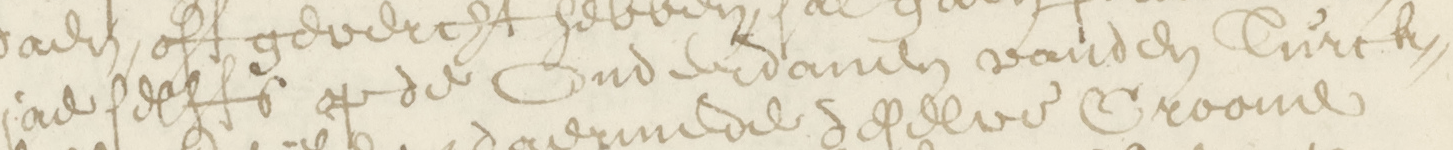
jae selffs opde Onderdanen vanden Turck„
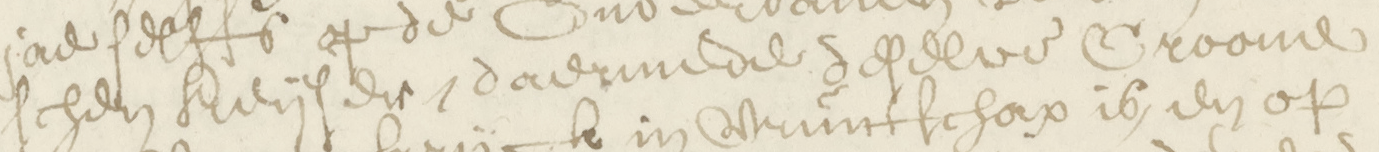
schen Keijser, daermede deselve Croone
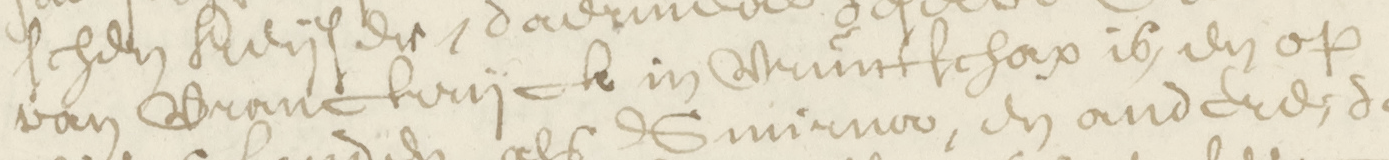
van Vranckrijck in Vruntschap is, en op
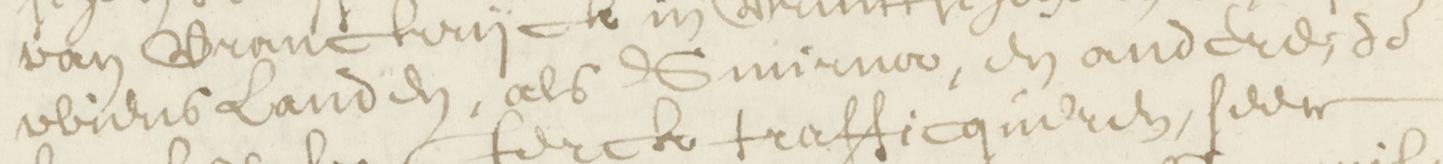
wiens Landen, als Smirna, en andere, de
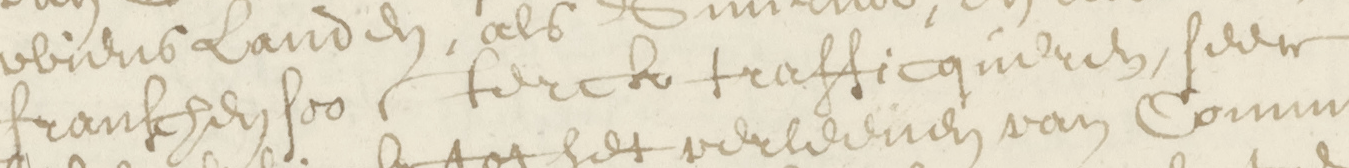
franschen soo sterck trafficqueren, seer
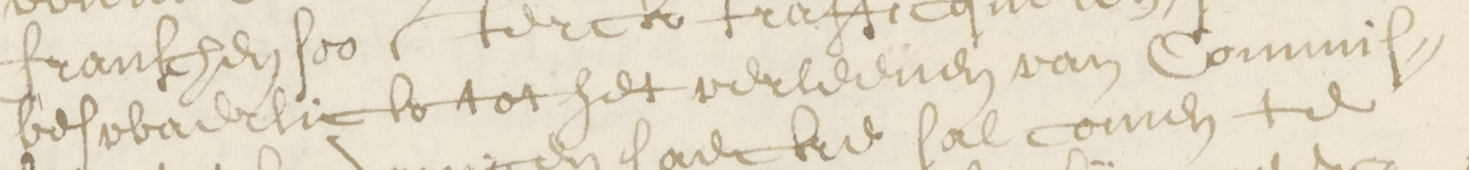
beswaerlick tot het verleenen van Commis„
